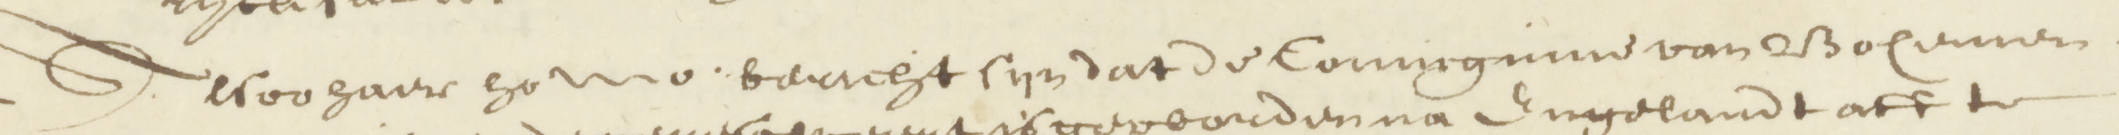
Alsoo haer ho Mo: bericht syn dat de Coninginne van Bohemen
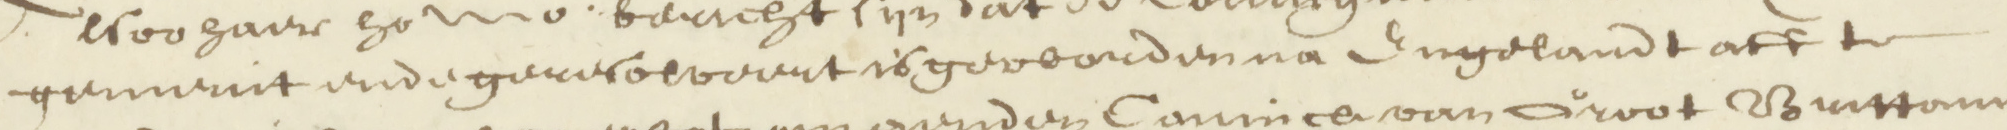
gemeint ende geresolveert is geworden na Engelandt aff te
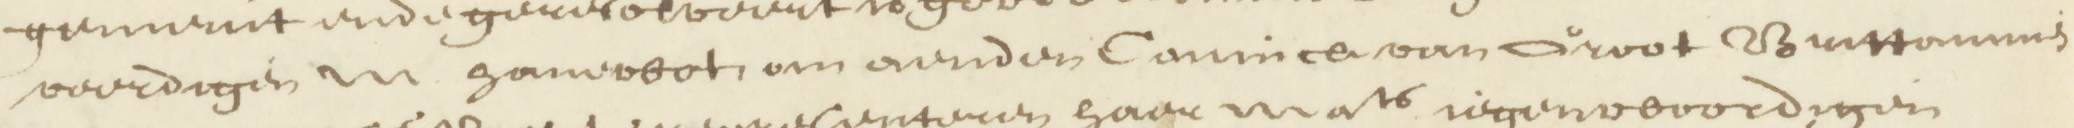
veerdigen M hanewot, om aenden Coninck van Groot Brittannien
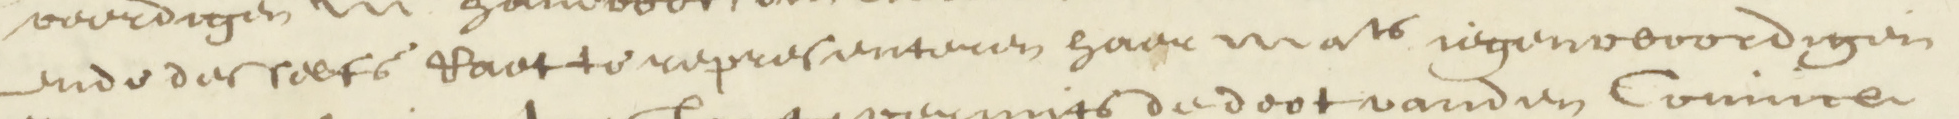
ende desselfs Raet te representeren haer Mats iegenwoordigen
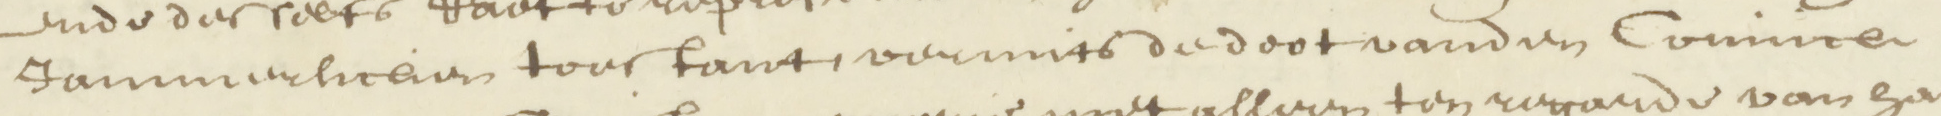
Jammerlicken toestant, vermits de doot vanden Coninck
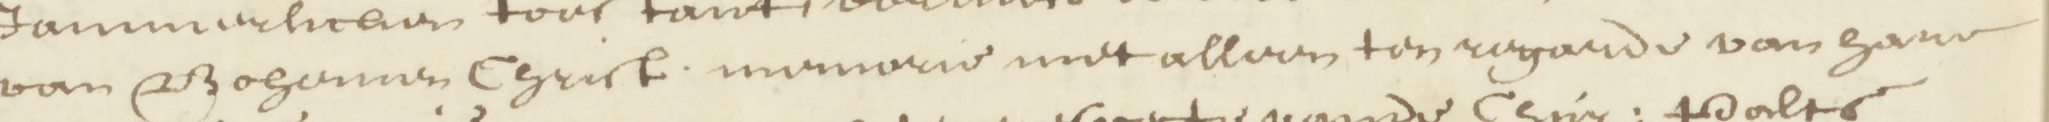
van Bohemen Christ. memorie met alleen ten regarde van hare
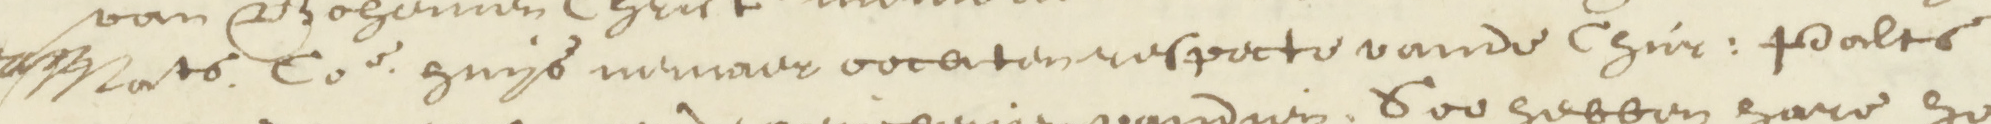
Mats. Cos. huijs nemaer oock ten respecte vande Chur: Palts
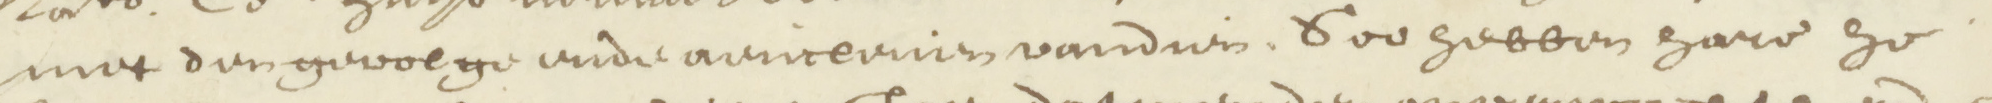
met den gevolge ende aencleuen vandien, Soo hebben hare ho.
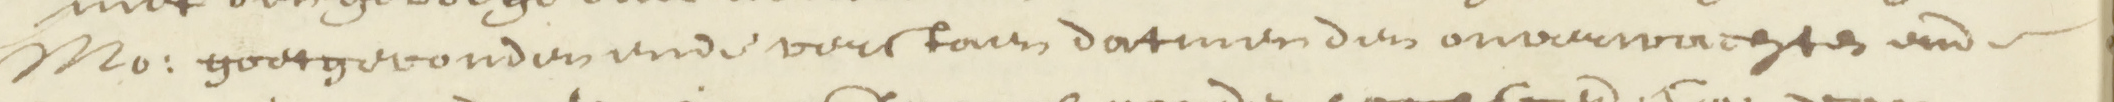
Mo: goetgevonden ende verstaen datmen den onverwachten ende
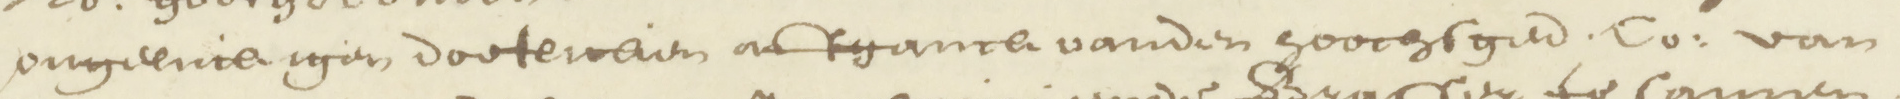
ongeluckigen doetlicken affganck vanden hoochsged. Co: van
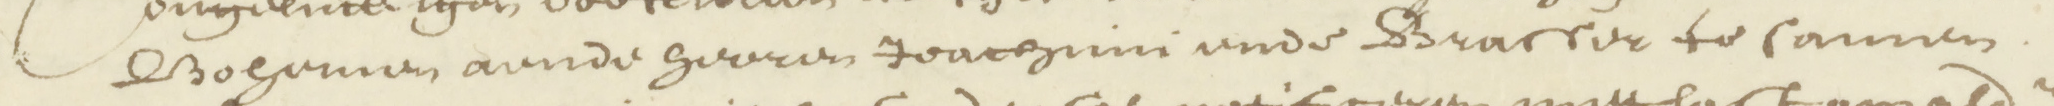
Bohemen aende heeren Joachimi ende Brasser te samen
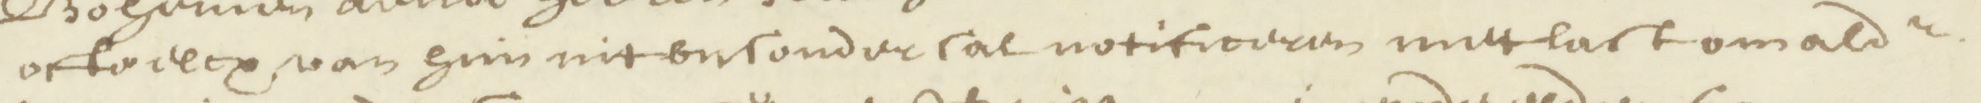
offe elcx van hun int bysonder sal notificeren met last om aldr.
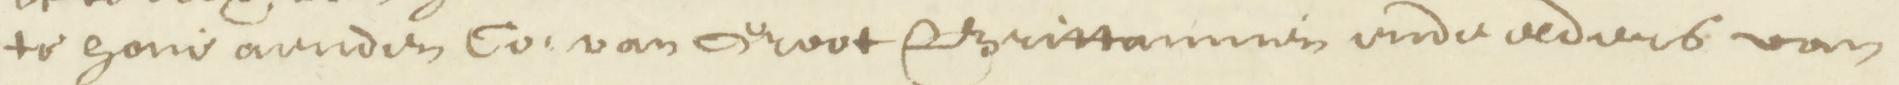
to houe aenden Co: van Groot Brittannien ende elders van
